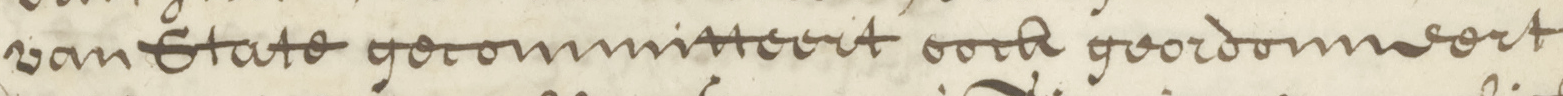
van State gecommitteert oock geordonneert
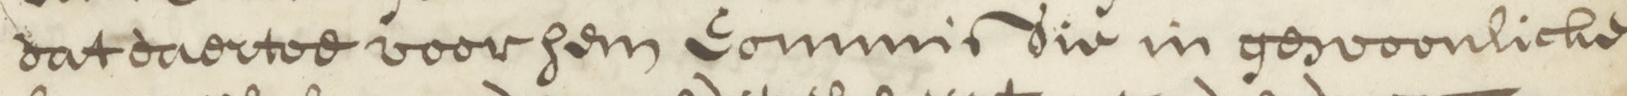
dat daertoe voor hem Commissie in gewoonlicke
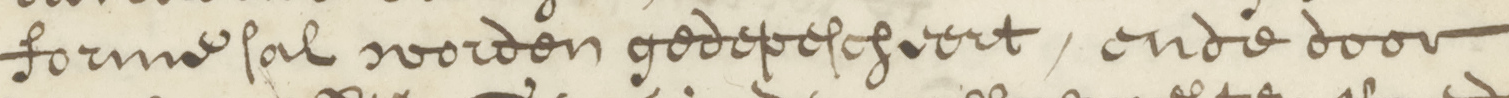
forme sal worden gedepescheert, ende door
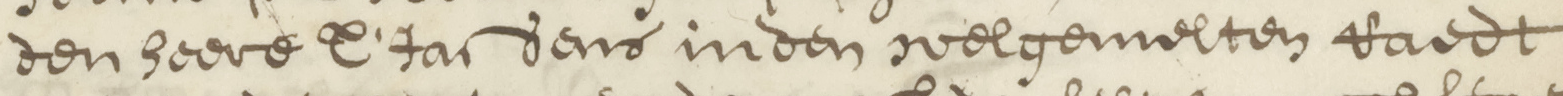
den heere T‛Jassens inden welgemelten Raedt
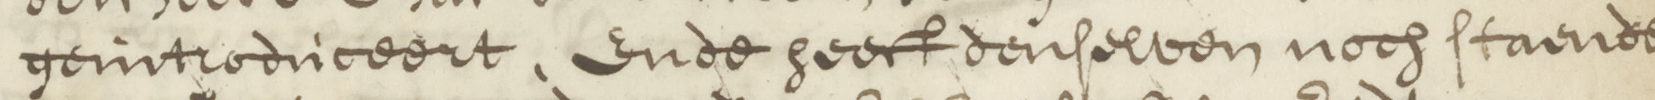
geintroduceert, Ende heeft denselven noch staende
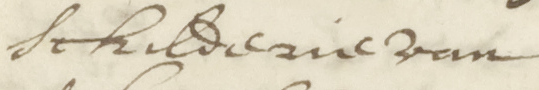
Schilderie van
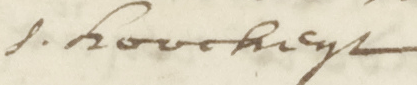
s. Hoocheyt
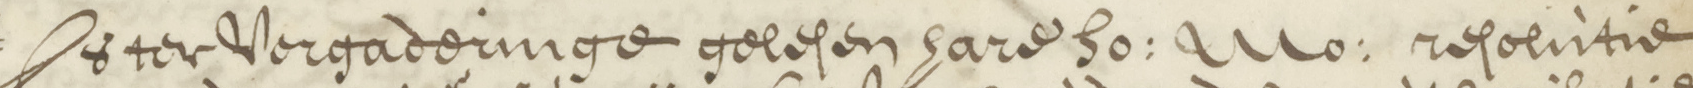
Is ter Vergaderinge gelesen hare ho:Mo: resolutie
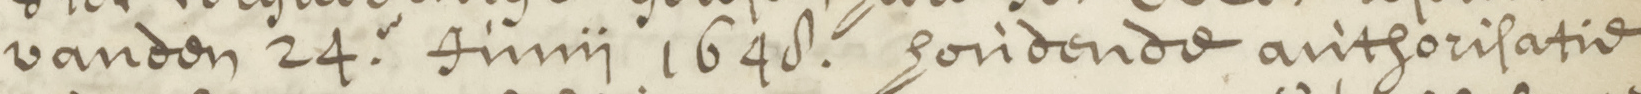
van den 24e. Junij 1648. houdende authorisatie
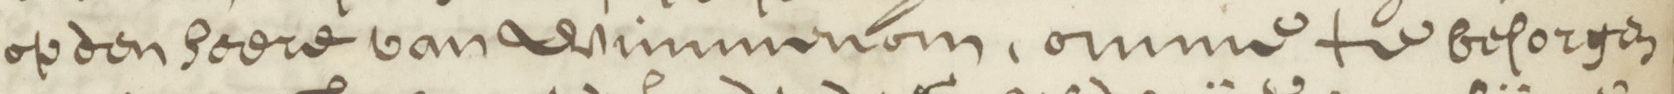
op den heere van Wimmenom, omme te besorgen
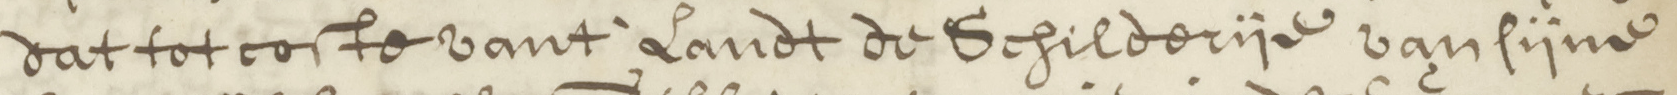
dat tot coste vant‛ Landt de Schilderije van sijne
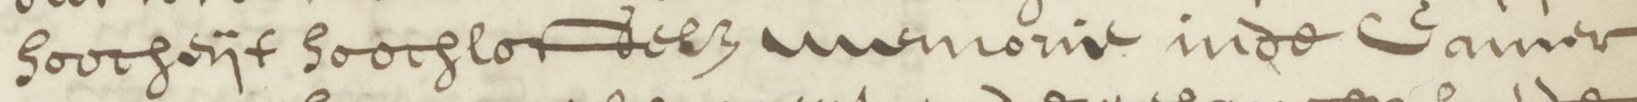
hoocheijt hoochloffel Memorie inde Camer
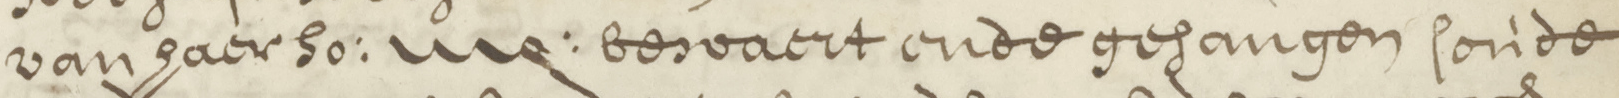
van haer ho:Mo: bewaert ende gehangen soude
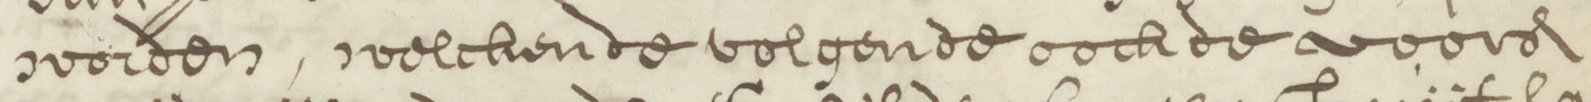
worden, welcken de volgende oock de voors
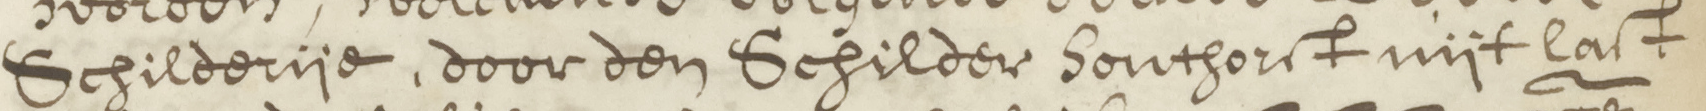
Schilderije, door den Schilder honthorst uijt last
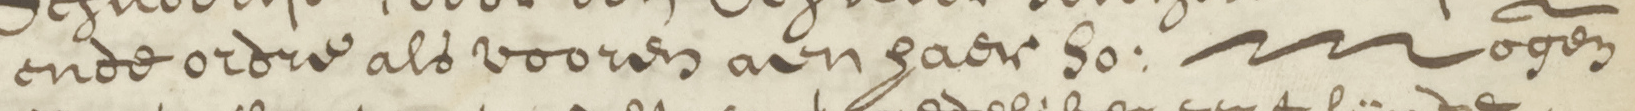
ende ordre als vooren aen haer ho:Mogen
